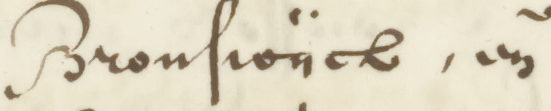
Bronswijck, en
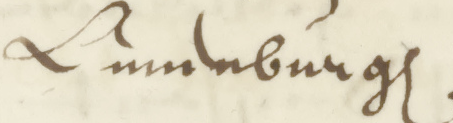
Lunenburgh
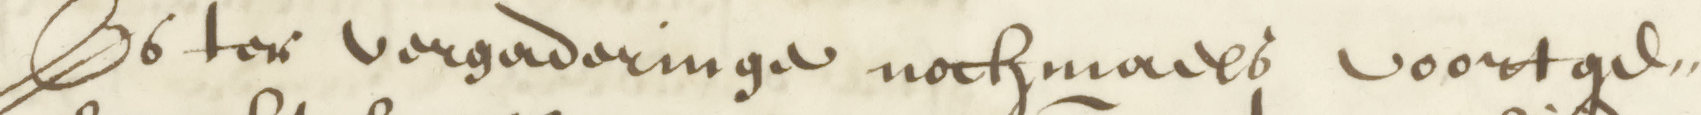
Is ter vergaderinge nochmaels voortge,,
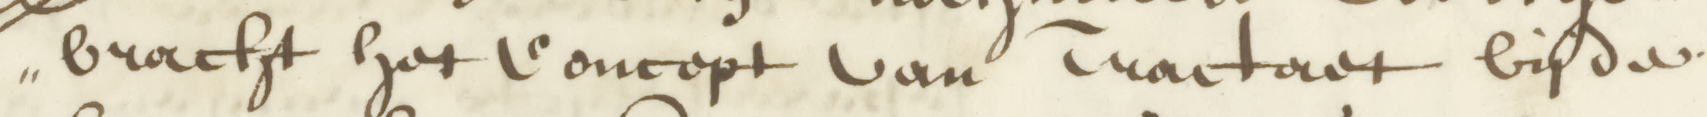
,,bracht het Concept van Tractaet bij de
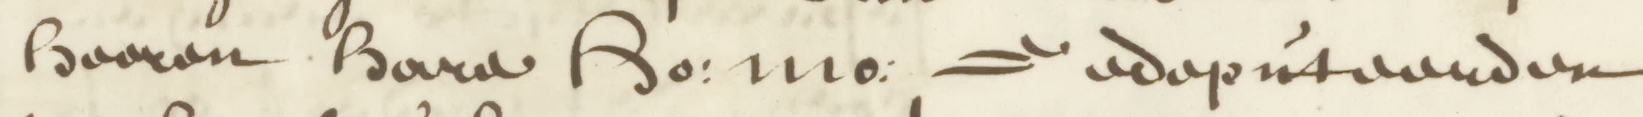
heeren hare Ho:Mo: Gedeputeerden
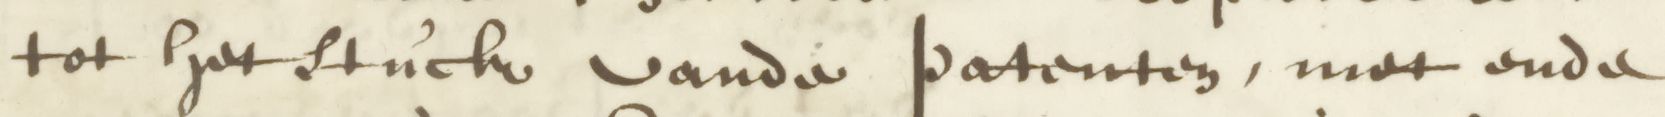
tot het stuck vande patenten, met ende
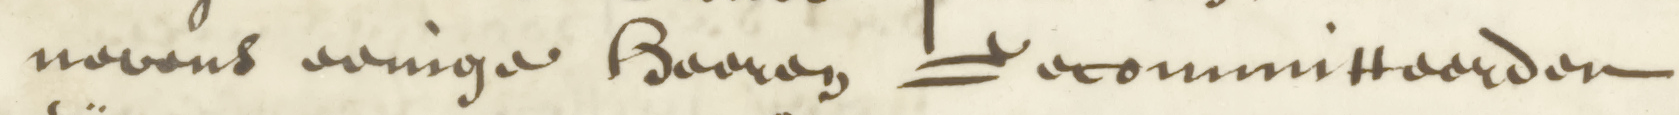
nevens eenige Heeren Gecommitteerden
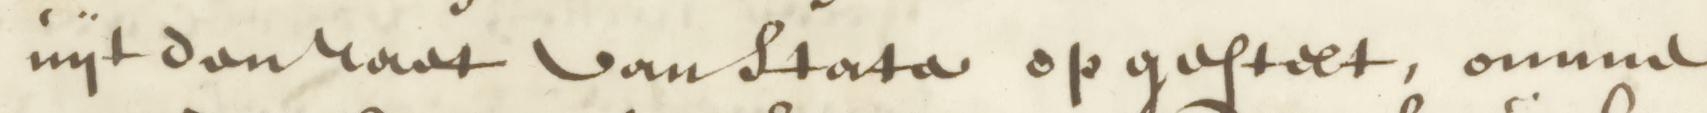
uijt den raet van State op gestelt, omme
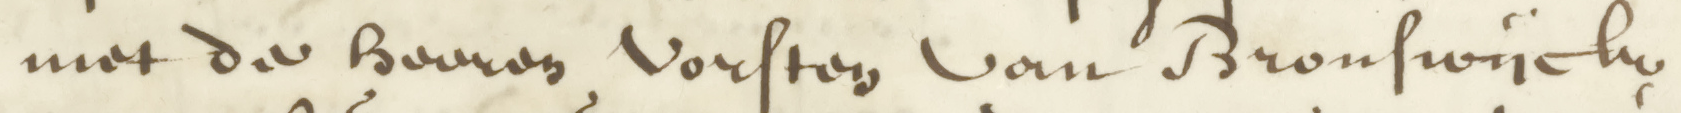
met de heeren vorsten van Bronswijck
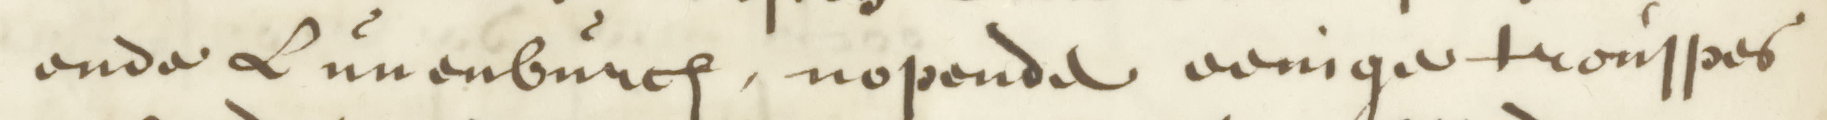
ende Lunenburch, nopende eenige trouppes
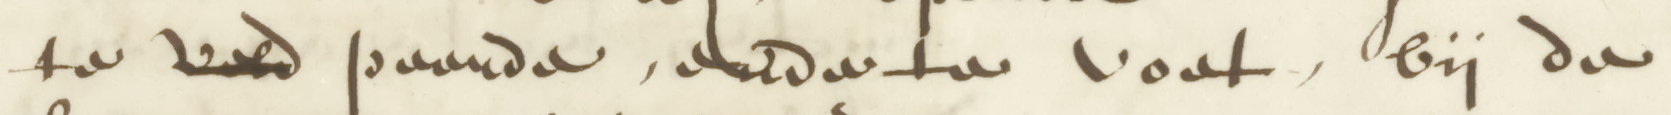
te veld peerde, ende te voet, bij de
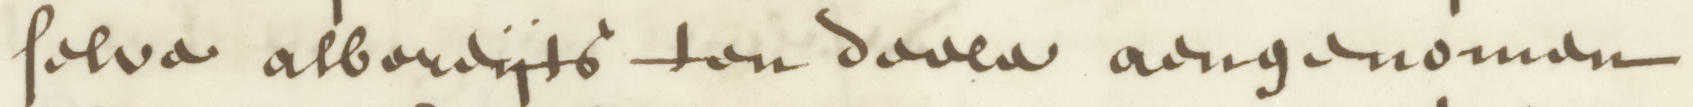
selve albereijts ten deele aengenomen
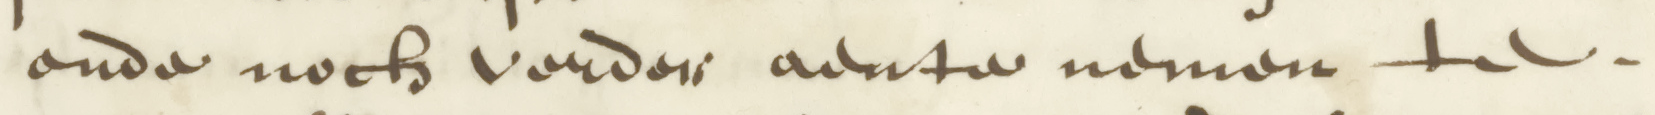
ende noch verder aente nemen te
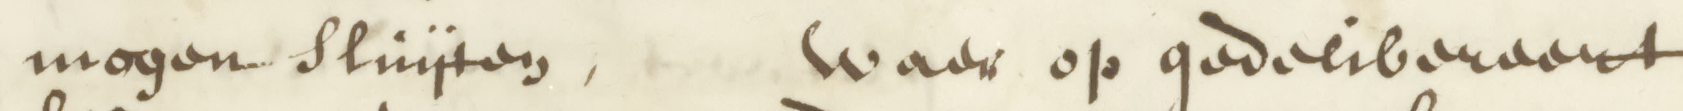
mogen sluijten. Waer op gedelibereert
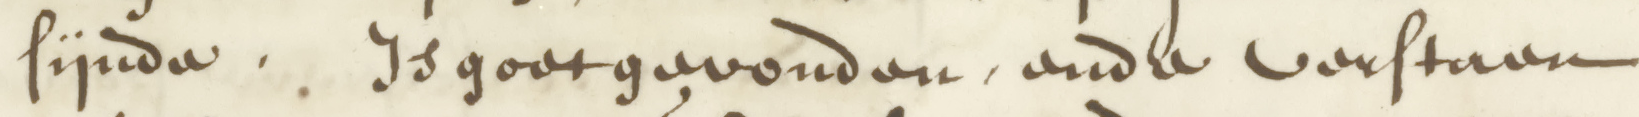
sijnde, Is goetgevonden, ende verstaen
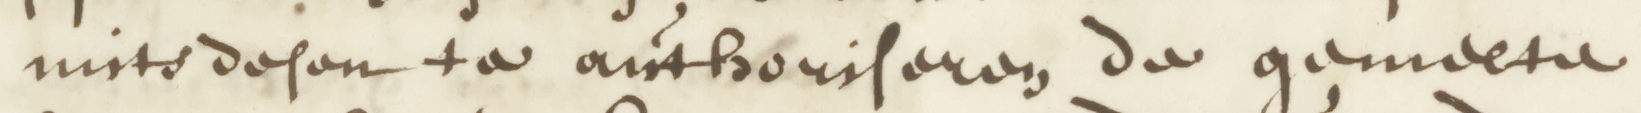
mits desen te authoriseren de gemelte
